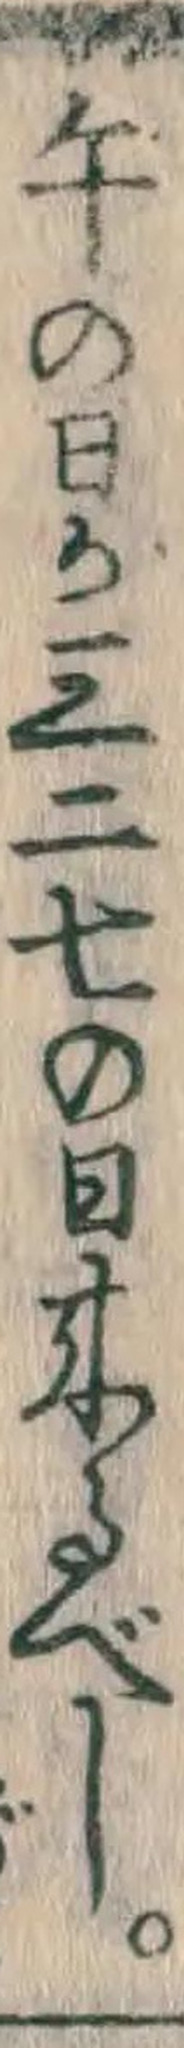午の日か三二七の日来るべし。
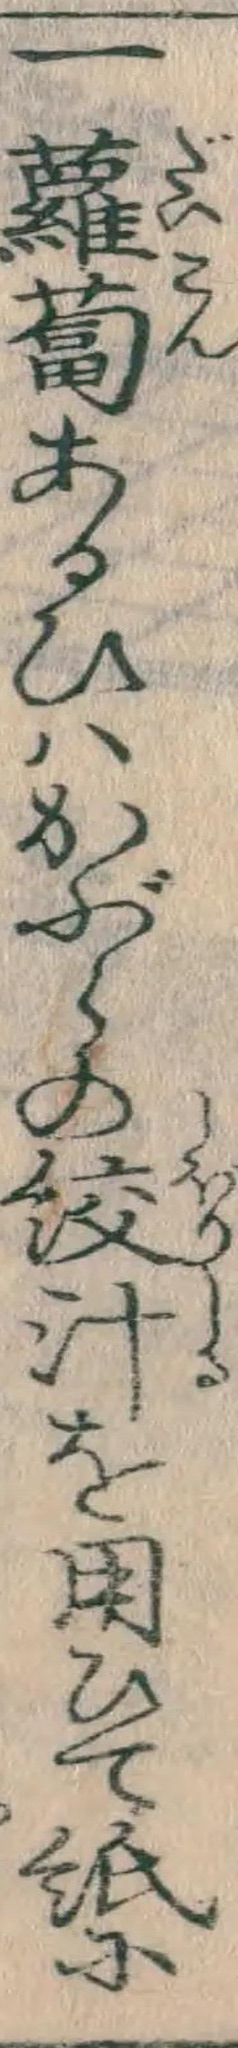一蘿蔔あるひはかぶらの絞汁を用ひて紙に
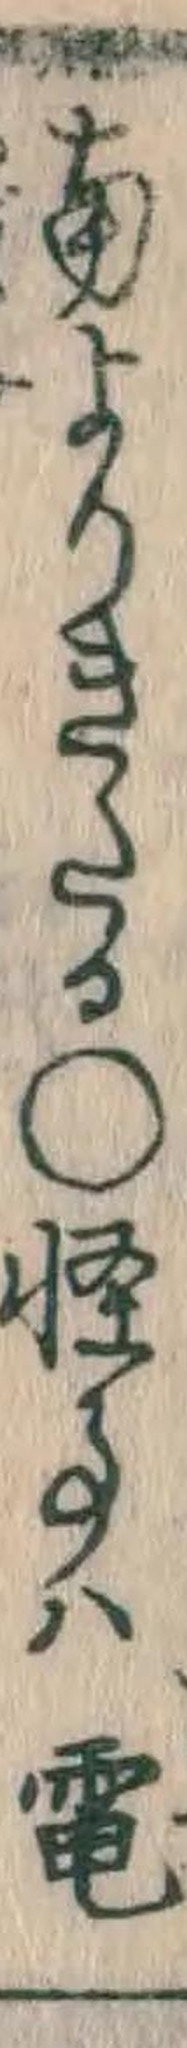南よりきたる○怪事は電
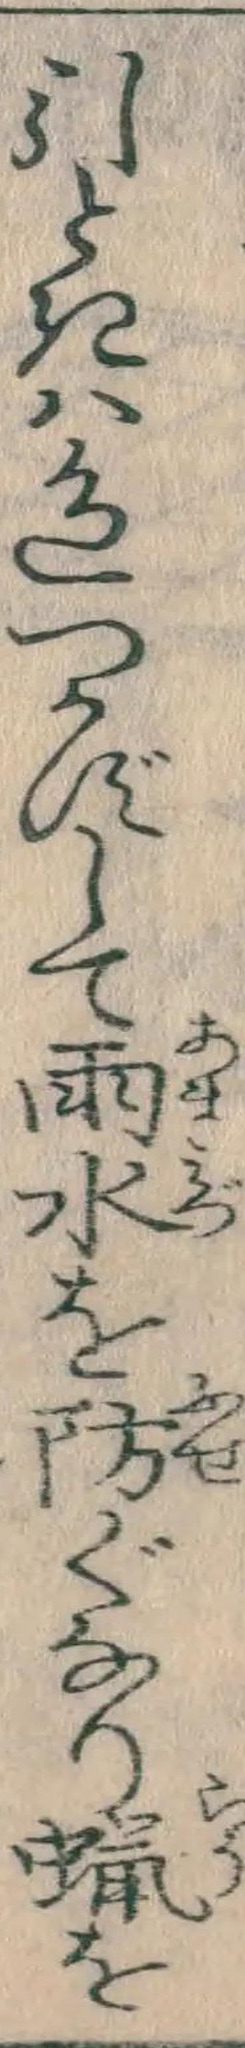引ときは色つかずして雨水を防ぐなり蠟を
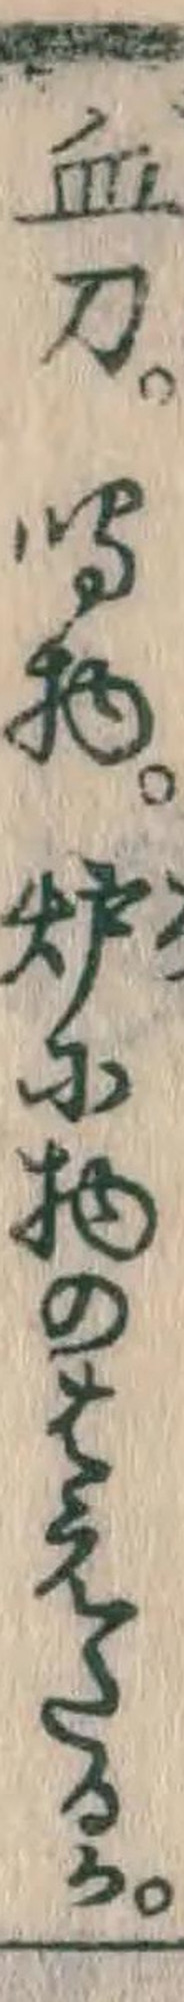血刀。鳴物。炉に物のはえたるか。
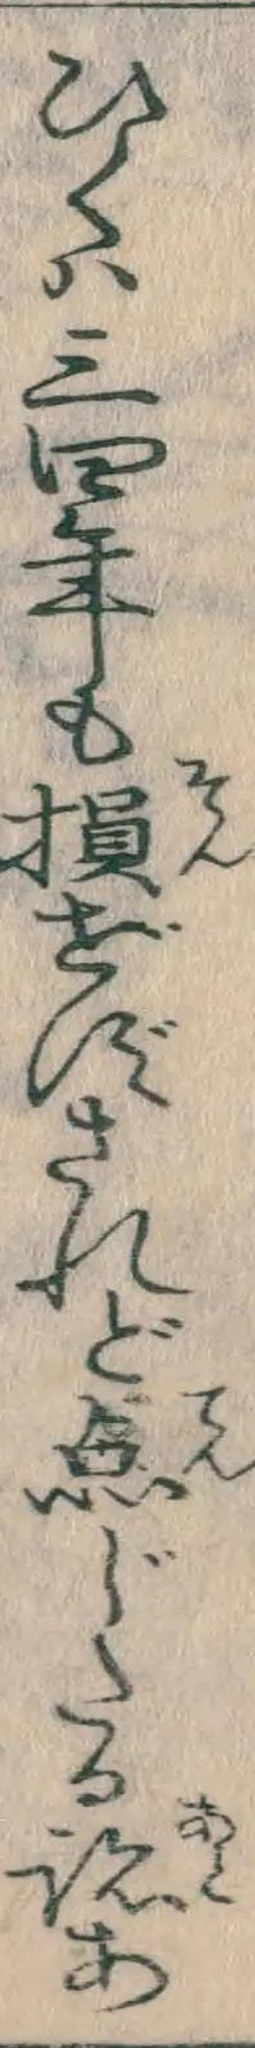ひくは三四年も損せずされど点じたる跡あ
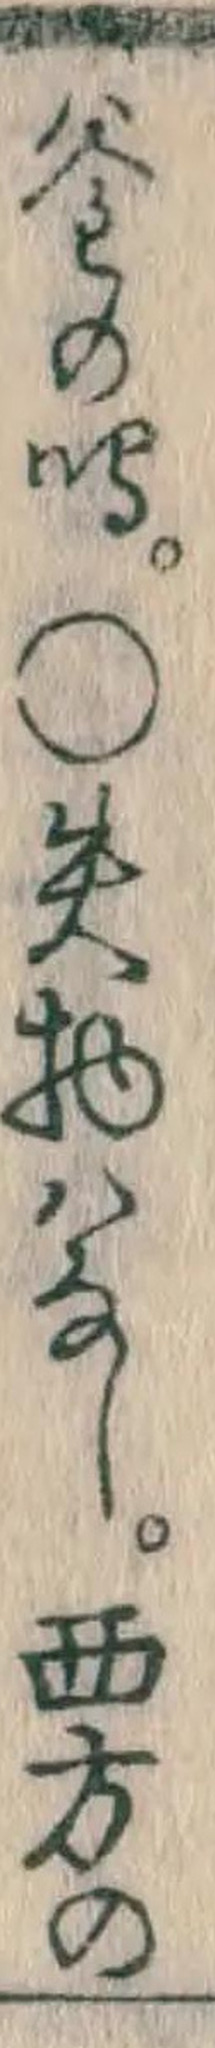釜の鳴。○失物はなし。西方の
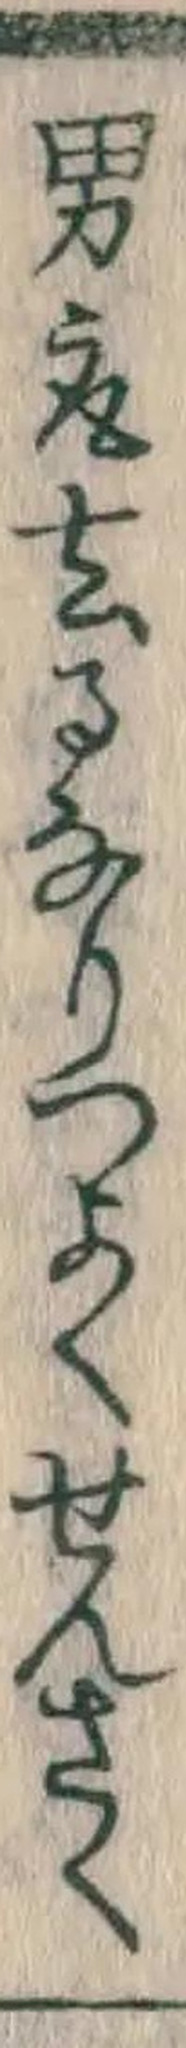男取去るなりつよくせんさく
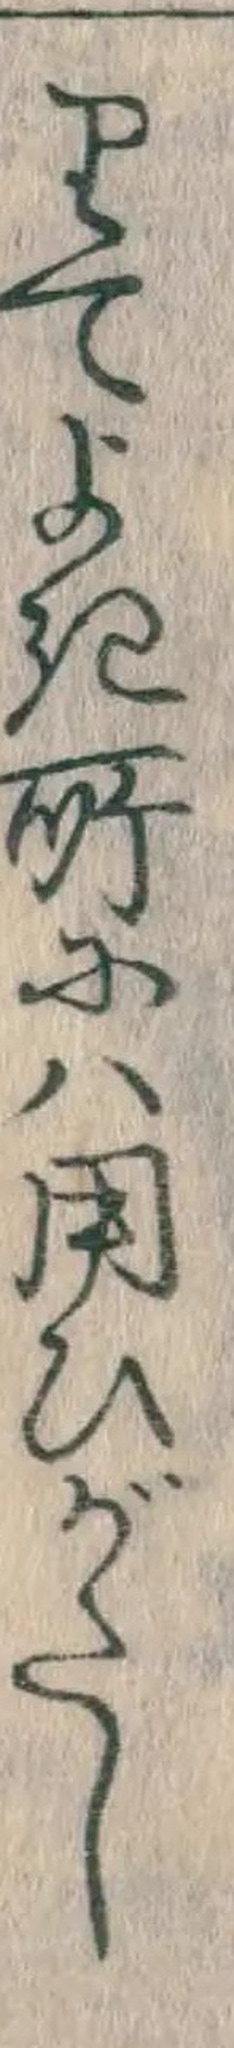りてよき所には用ひがたし
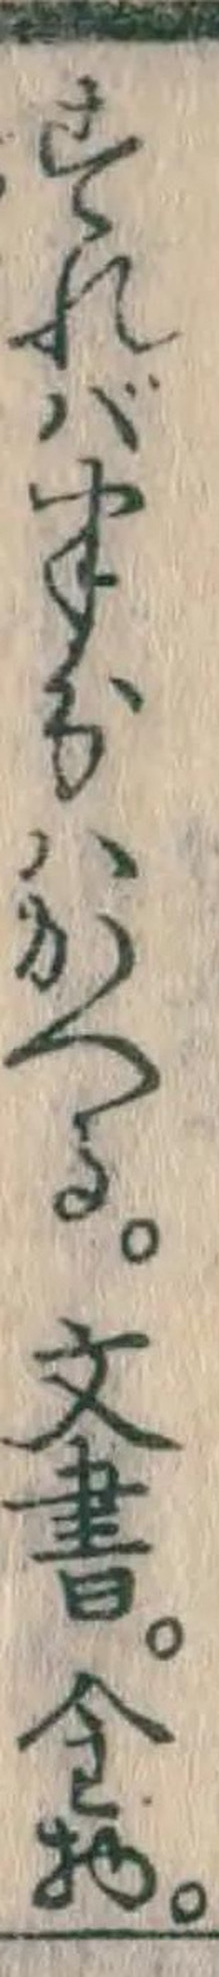すれば半分はかへる。文書。金物。
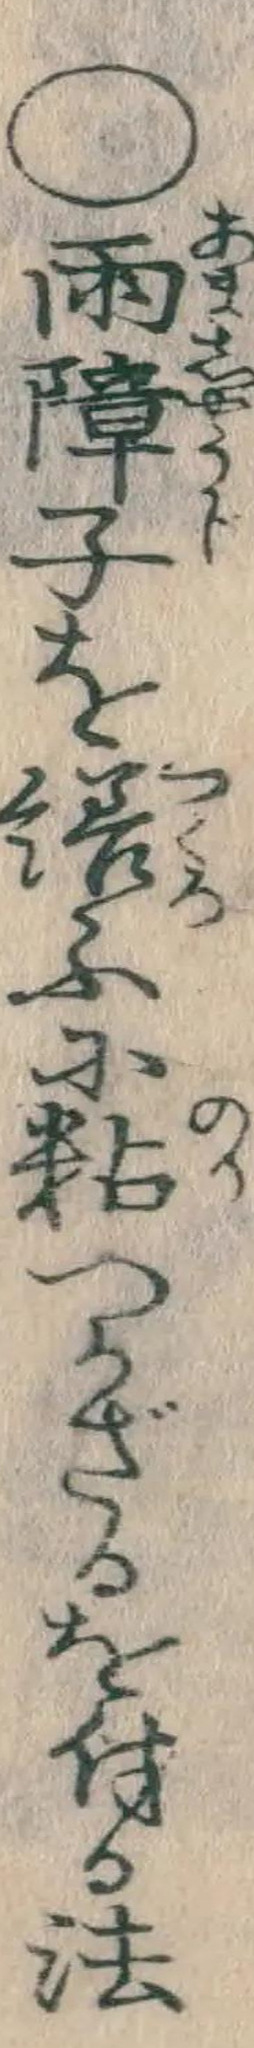○雨障子を繕ふに粘つかざるを付る法
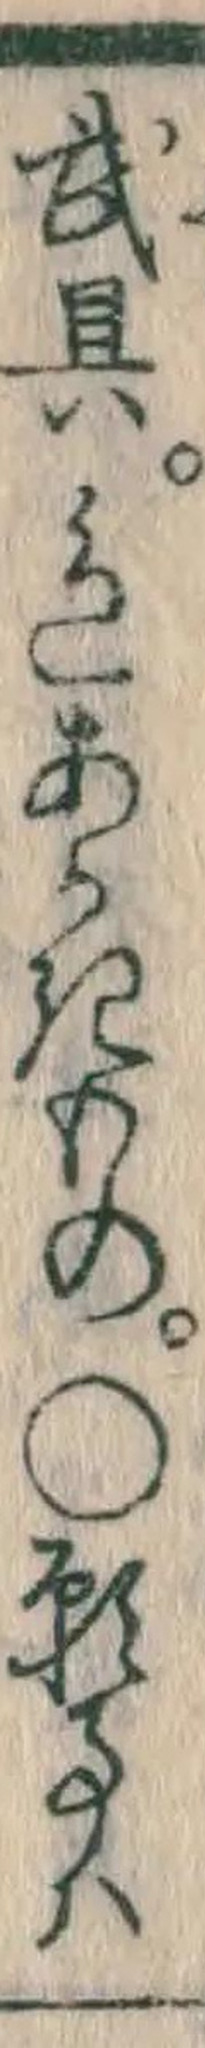武具。色あらきもの。○願事は
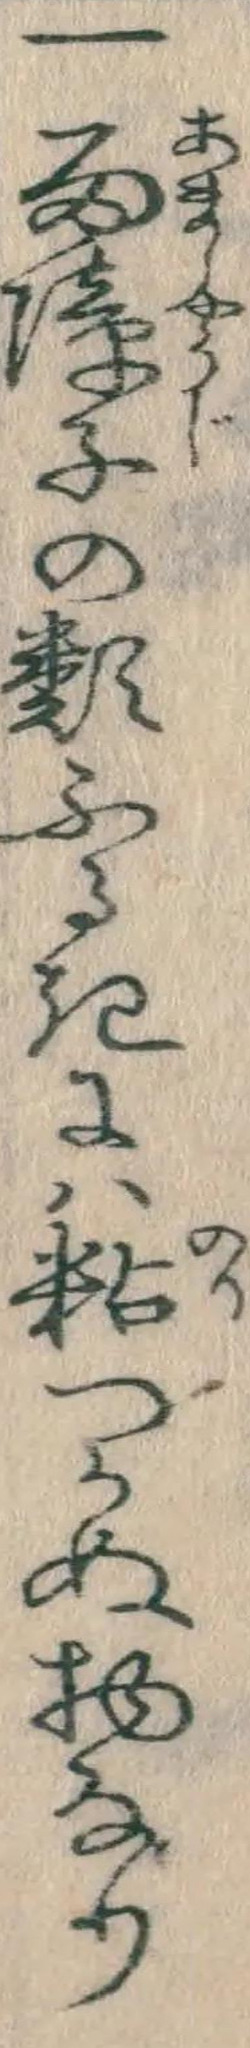一雨障子の類ふるきには粘つかぬ物なり
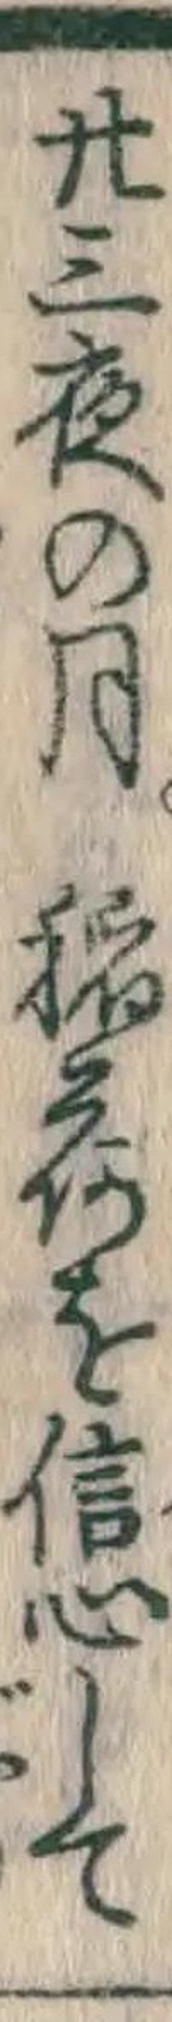廿三夜の月。稲荷を信心して
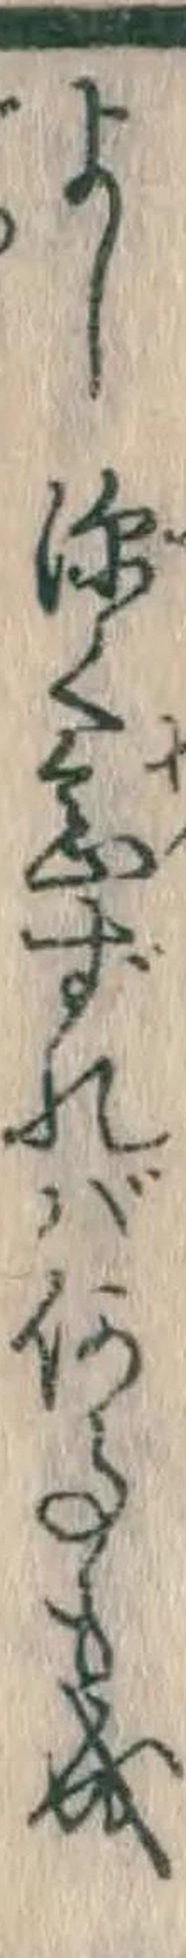よし深く念ずれば何事も成
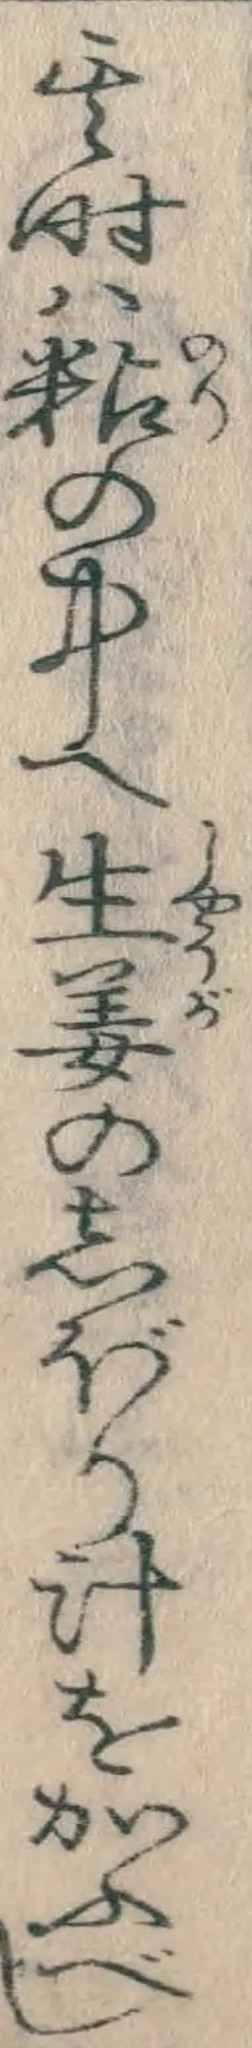其時は粘の中へ生姜のしぼり汁を加ふべし
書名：広益秘事大全 3巻. [1]
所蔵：国立国会図書館 National Diet Library, JAPAN
